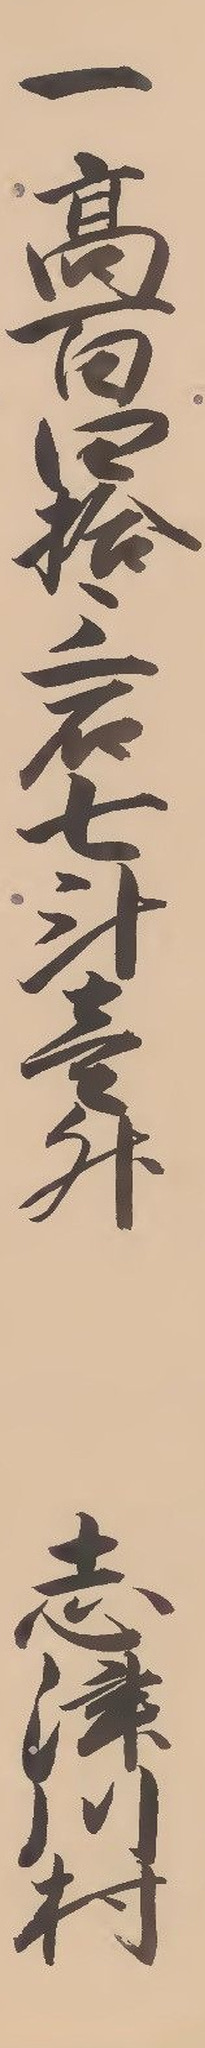一高百四拾三石七斗壱升志津川村
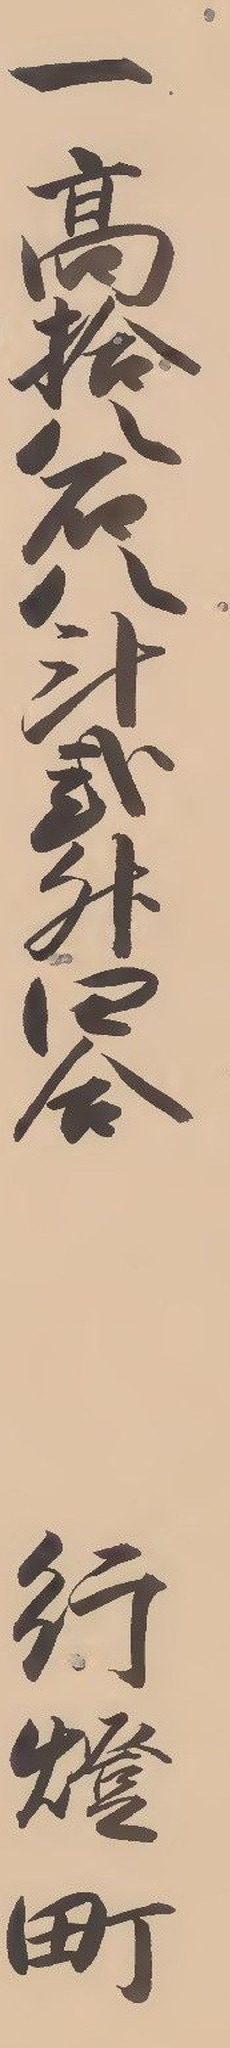一高拾八石八斗弐升四合行灯町
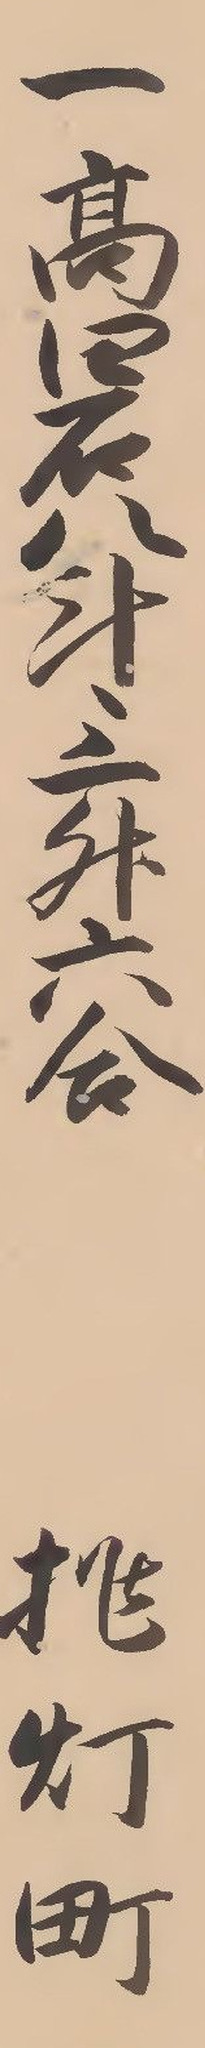一高四石八斗三升六合提灯町
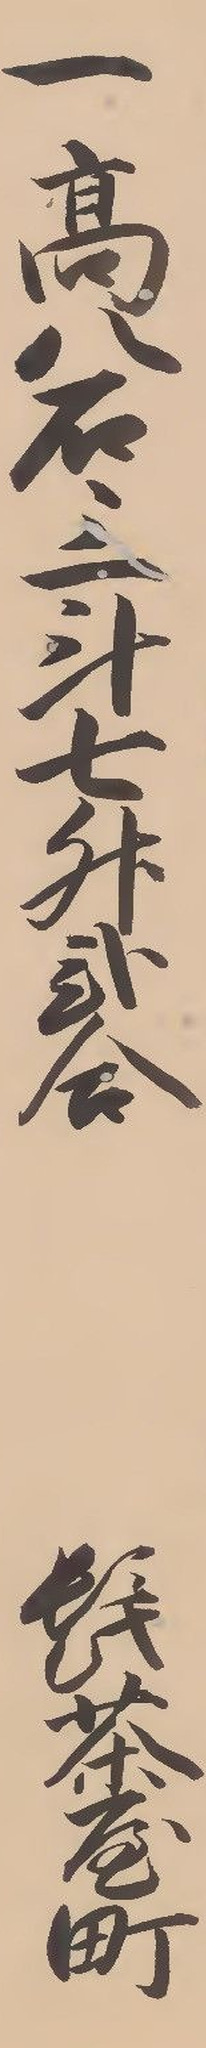一高八石三斗七升弐合髭茶屋町
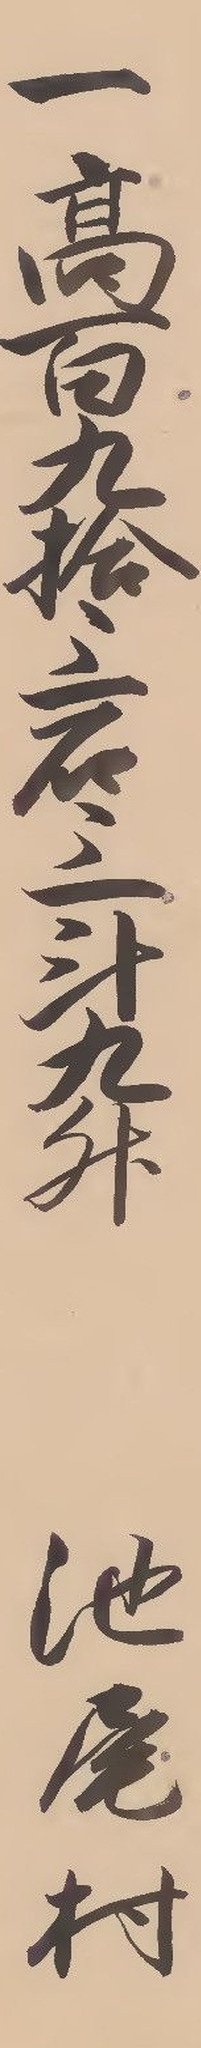一高百九拾三石三斗九升池尾村
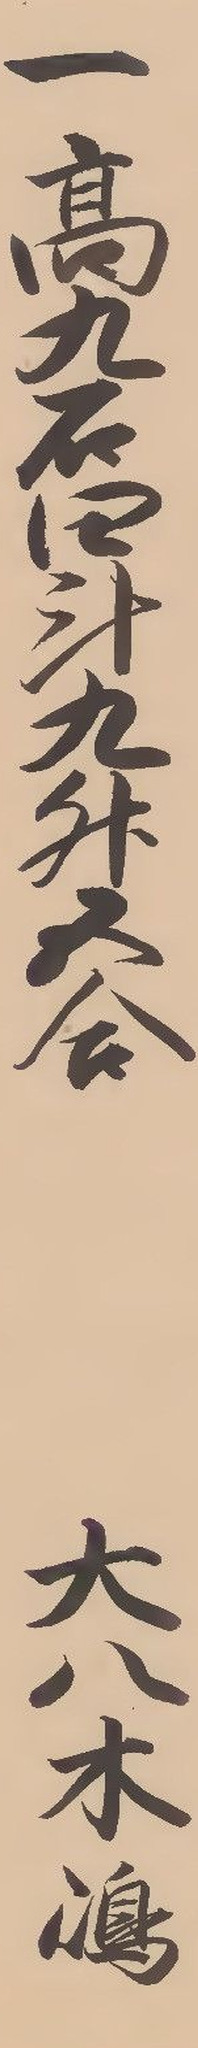一高九石四斗九升五合大八木島

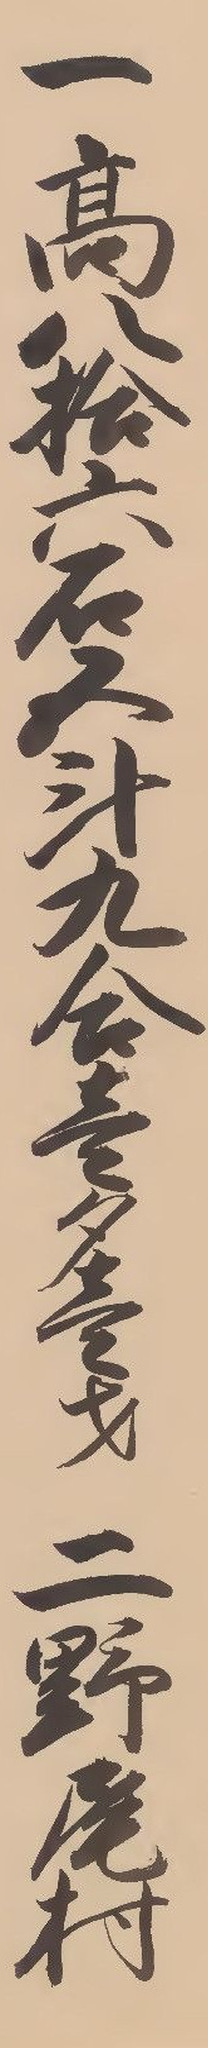一高八拾六石五斗九合壱勺壱才二野尾村
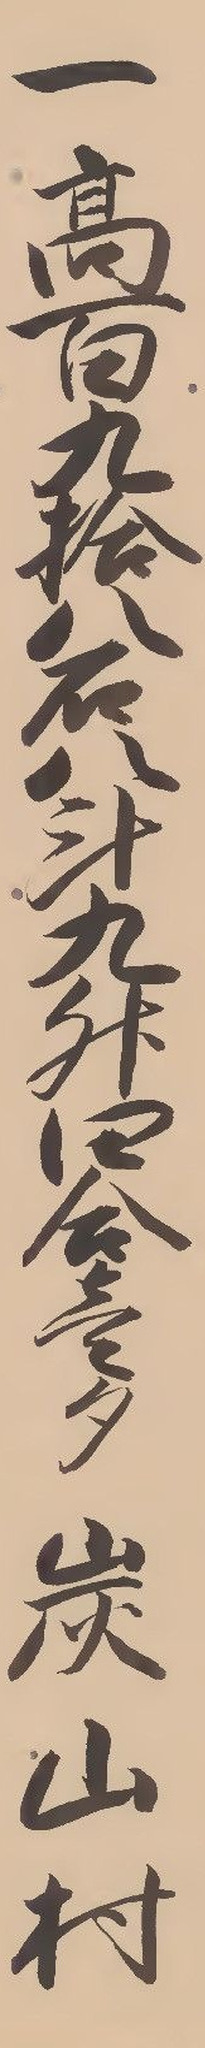一高百九拾八石八斗九升四合壱勺炭山村
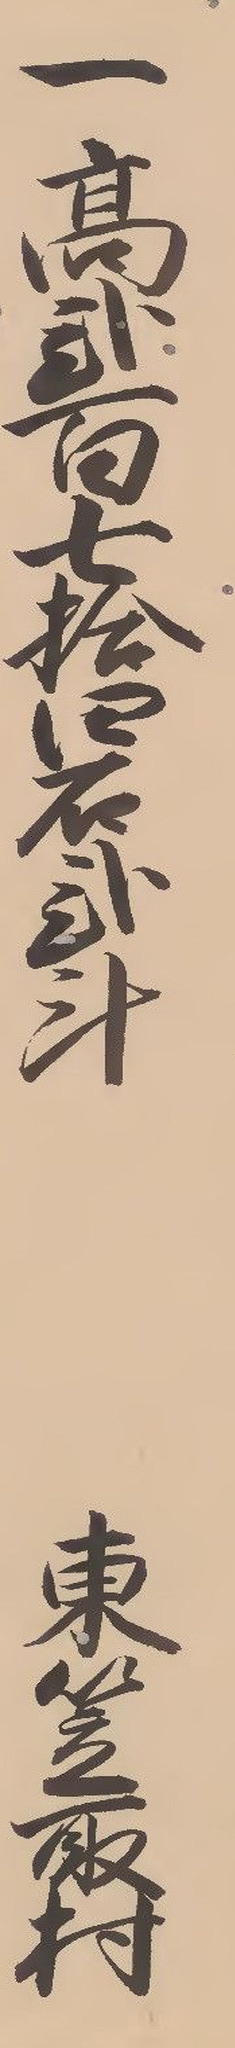一高弐百七拾四石弐斗東笠取村
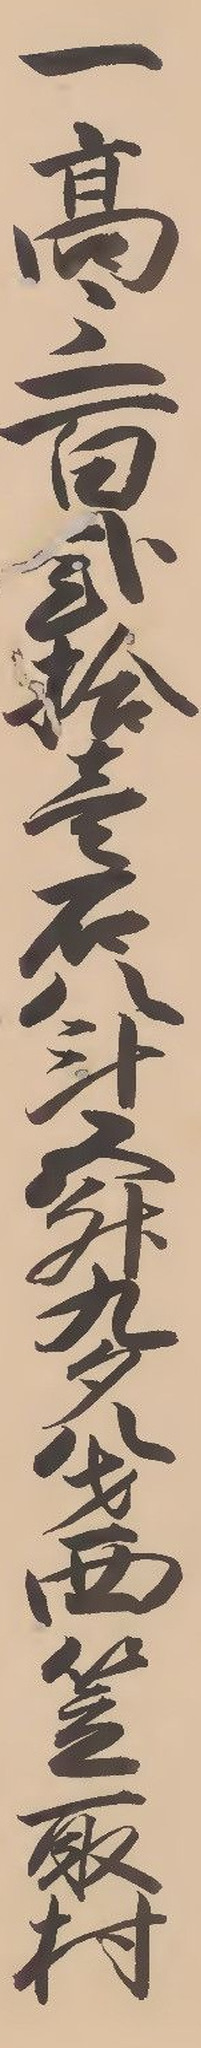一高三百弐拾壱石八斗五升九勺八才西笠取村
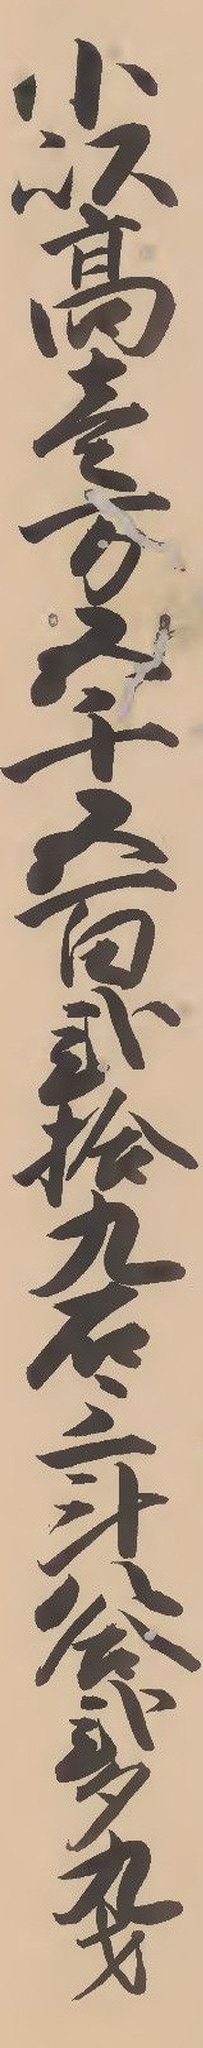小以高壱万五千五百弐拾九石三斗八合弐勺九才

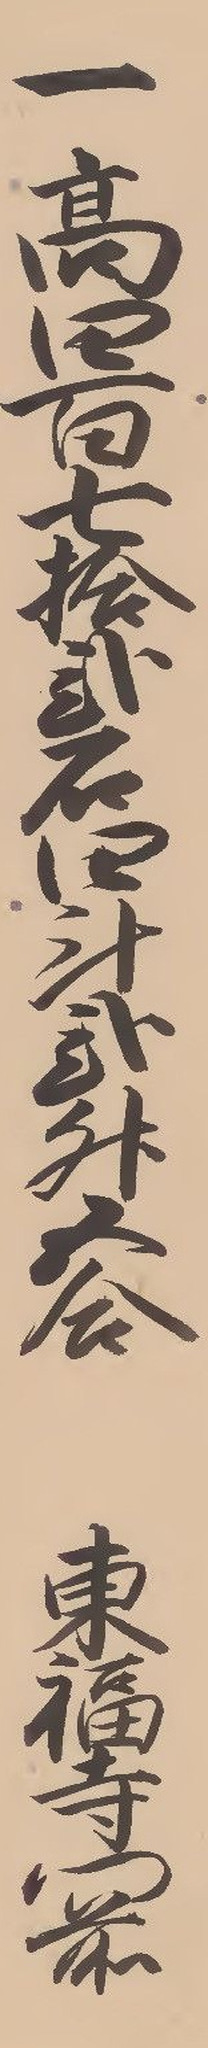一高四百七拾弐石四斗弐升五合東福寺門前
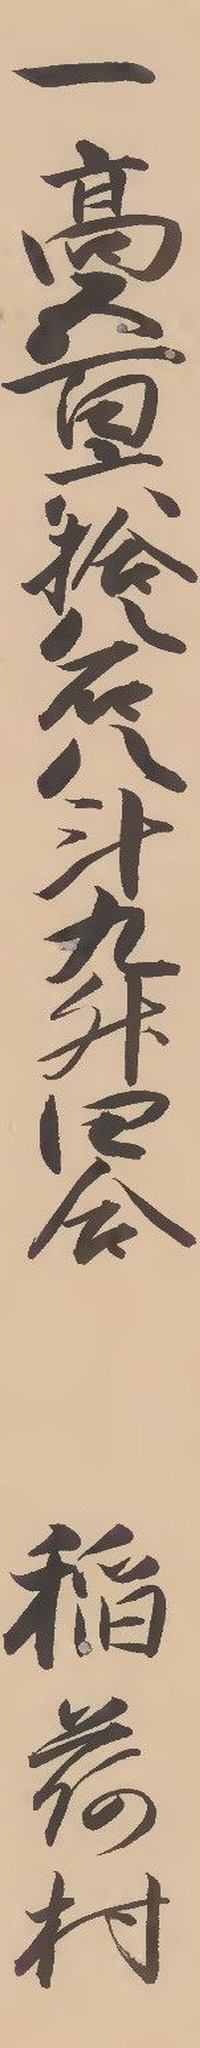一高五百六捨八石八斗九升四合稲荷村
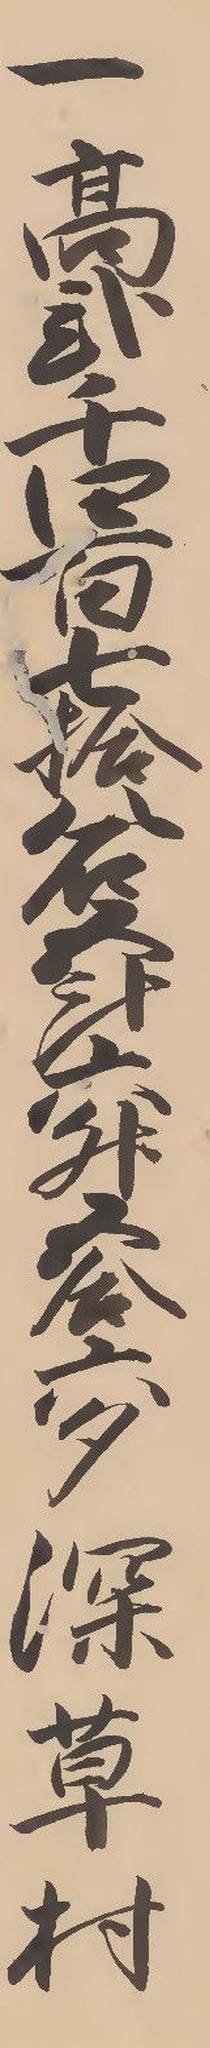一高弐千四百七拾八石五斗六升五合六勺深草村

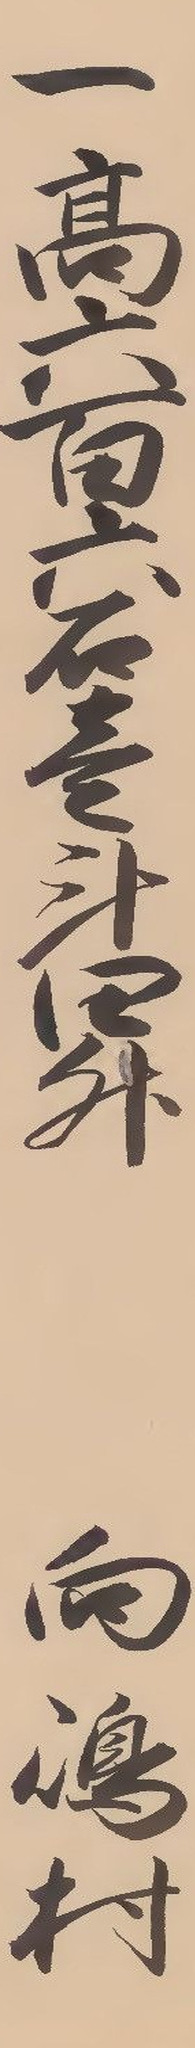一高六百六石壱斗四升向嶋村
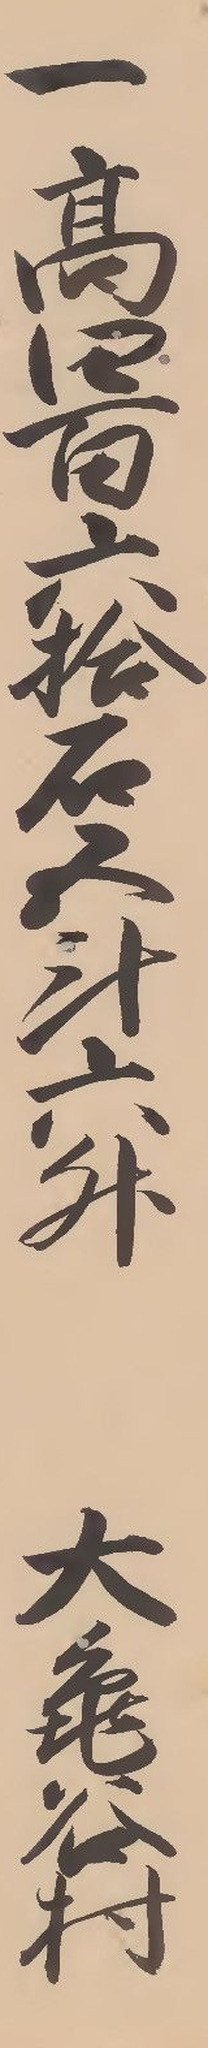一高四百六拾石五斗六升大亀谷村
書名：山城国郷帳
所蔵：国立公文書館 National Archives of Japan
